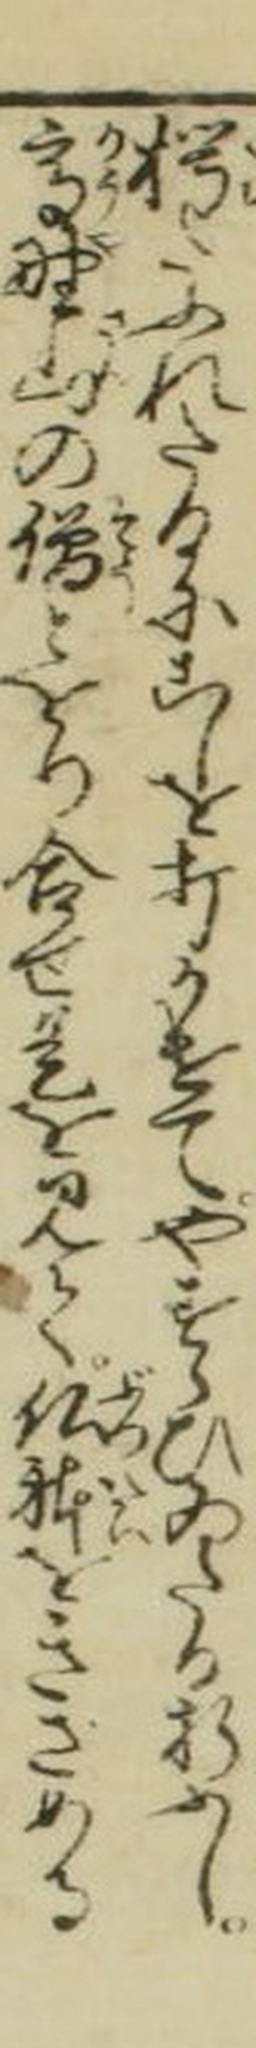高野山の僧とをり合せ是を見て。仏体をきざめる
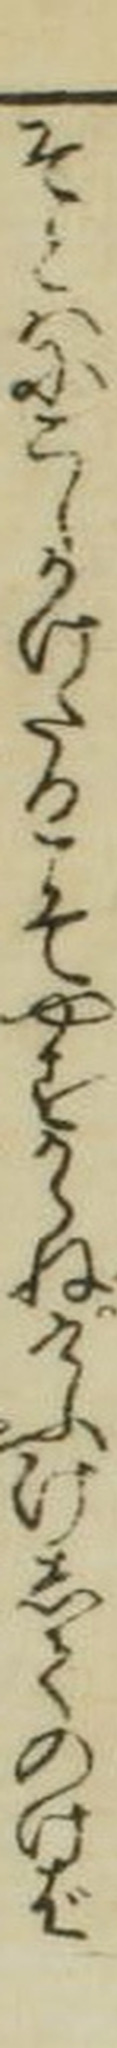そとはにこしかけたるこそやすからね。けふけしてのけば
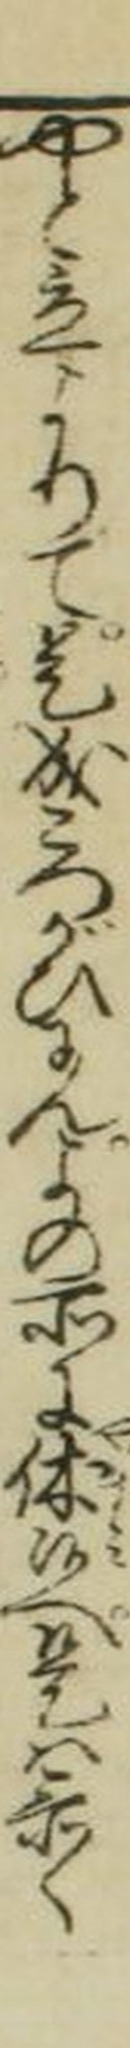やと立よりて。是成こつがひにん。よの所に休候へ。是は忝く
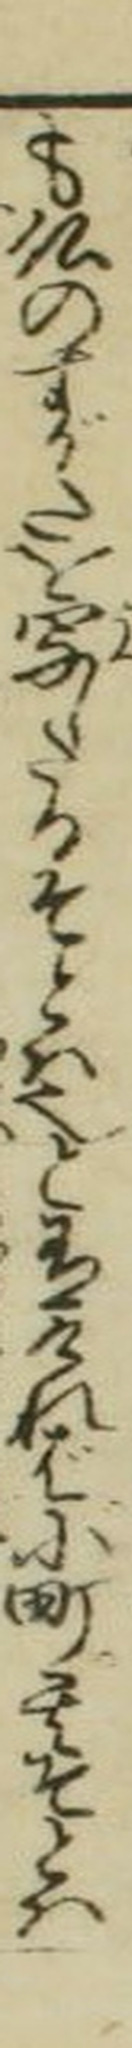も仏のすがたを写したるそとは也と有ければ小町其そとは
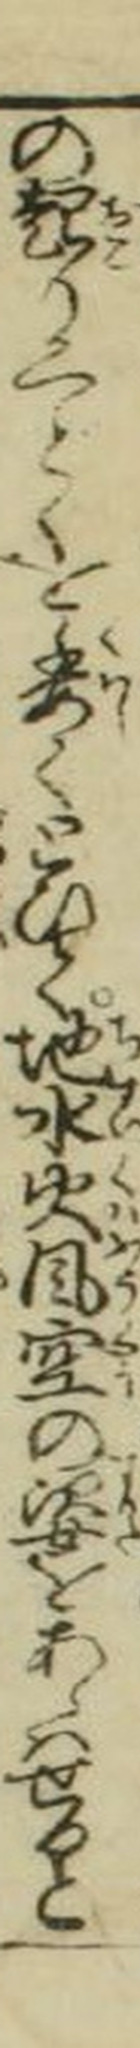の起りくどくを委くとひて。地水火風空の姿をあらはせると
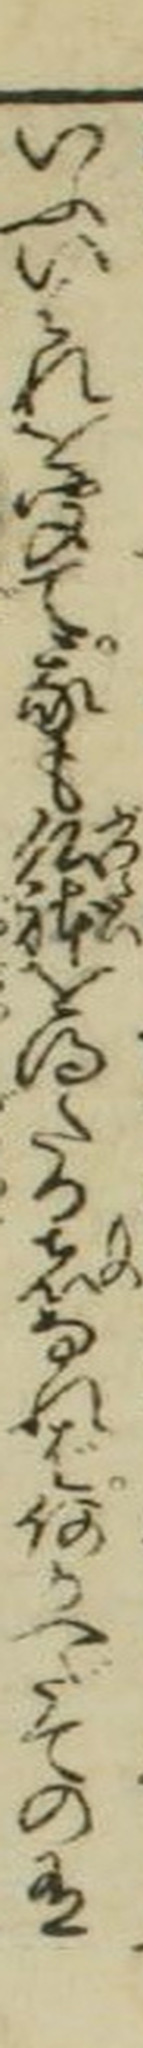いふいはれを聞て。我も仏体を得たる者なれば。何かへだての有
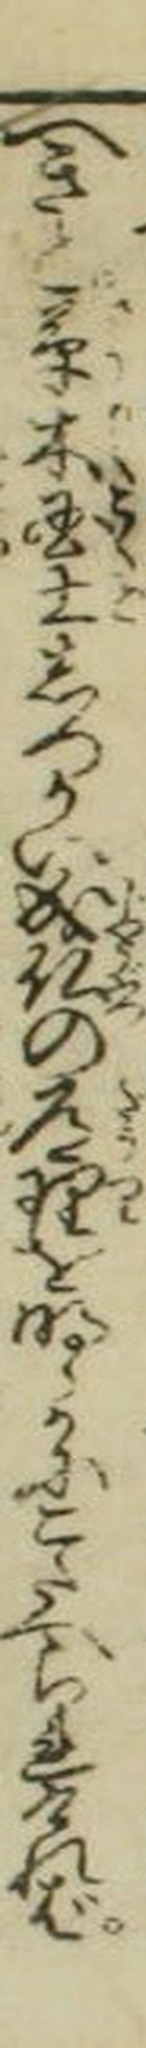へきと。草木国土しつかい成仏の道理を明らかにこたへられければ。
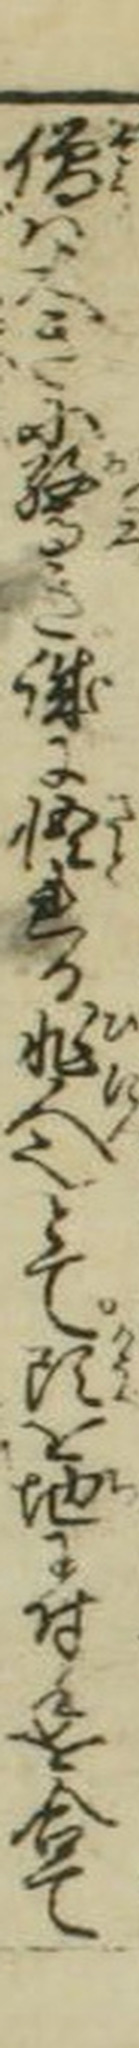僧は大きに驚き誠に悟れる非人也とて。頭を地に付手を合て
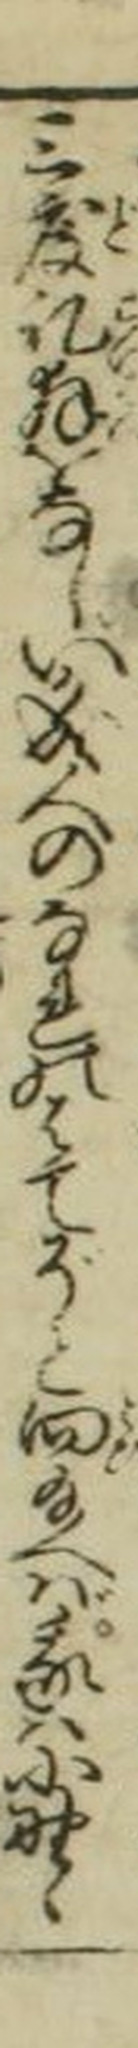三度礼拝をなしいか成人のなれのはてぞと問給へば。我は小野ゝ
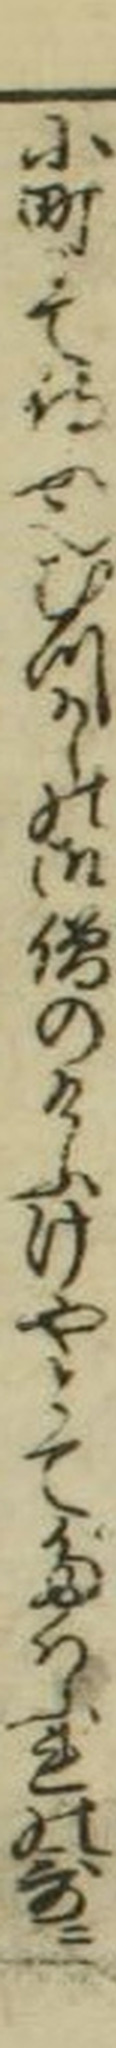小町にて侍ふ也。むつかしの御僧のけふけやとて。たはふれの哥に
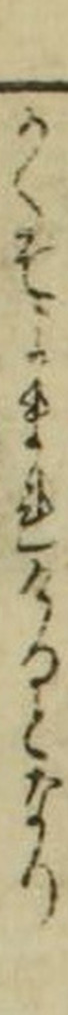かくぞよまれけるとなり
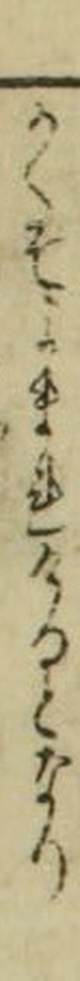かくぞよまれけるとなり
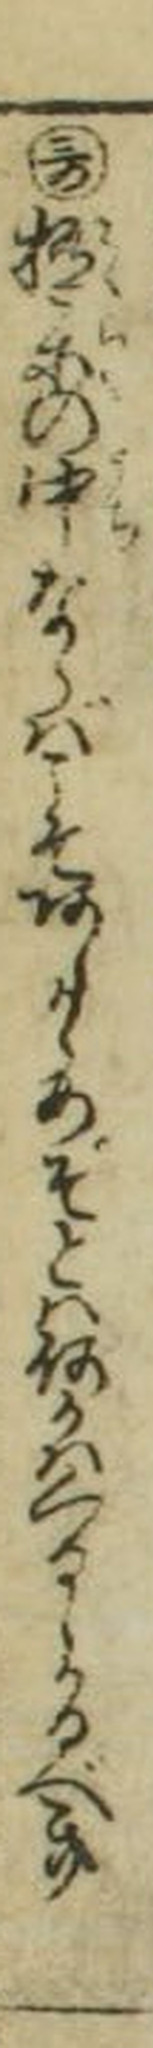哥極楽の中ならばこそあしからめ。そとは何かはくるしかるべき

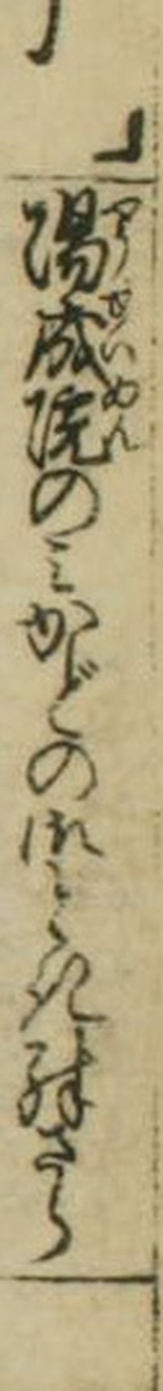陽成院のみかどの御とき殊さら
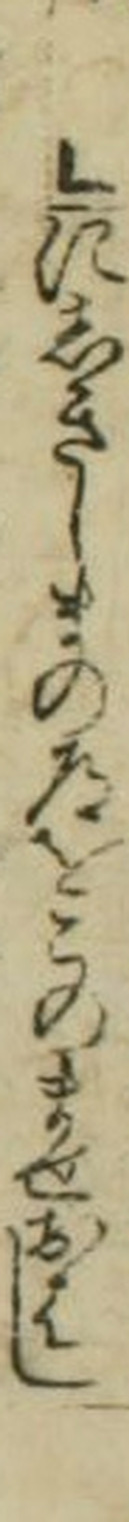にしきしまの道をこのませおはし
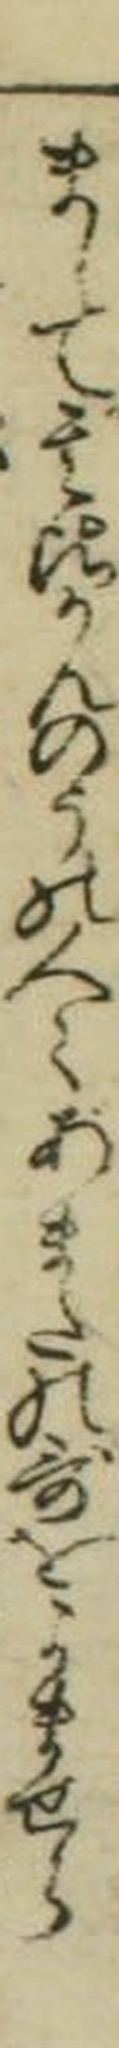まして其比かんのうの人々あまたの哥をよませら
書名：女源氏教訓鑑
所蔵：東京学芸大学附属図書館
